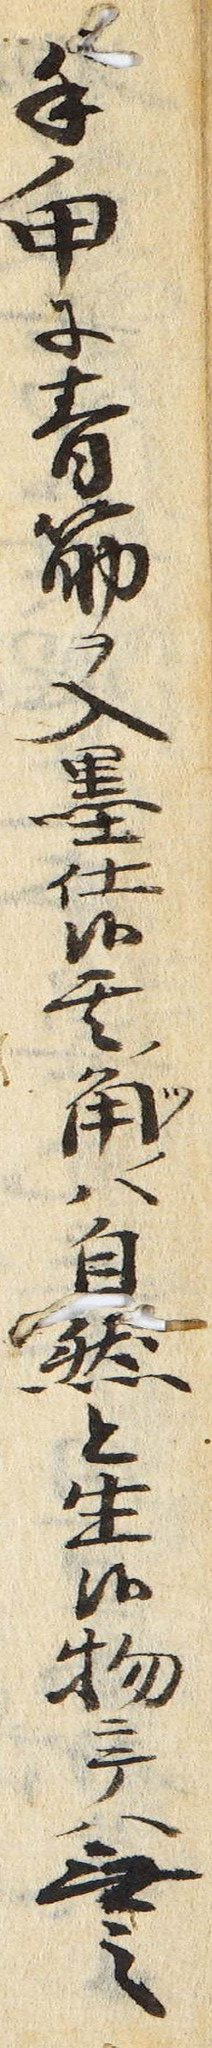手の甲に青筋を入墨仕候其の角は自然と生候物にては無之
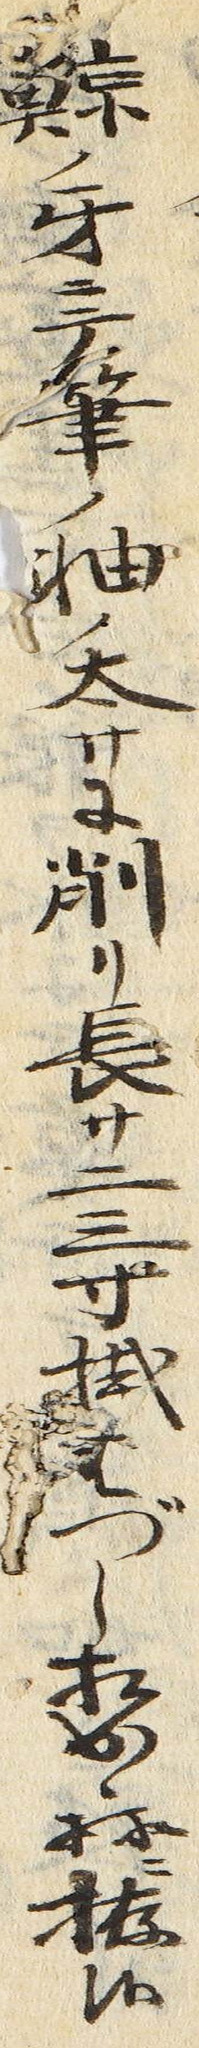鯨の牙にて筆の軸の太さに削り長さ二三寸掛はづし相成候様に拵候
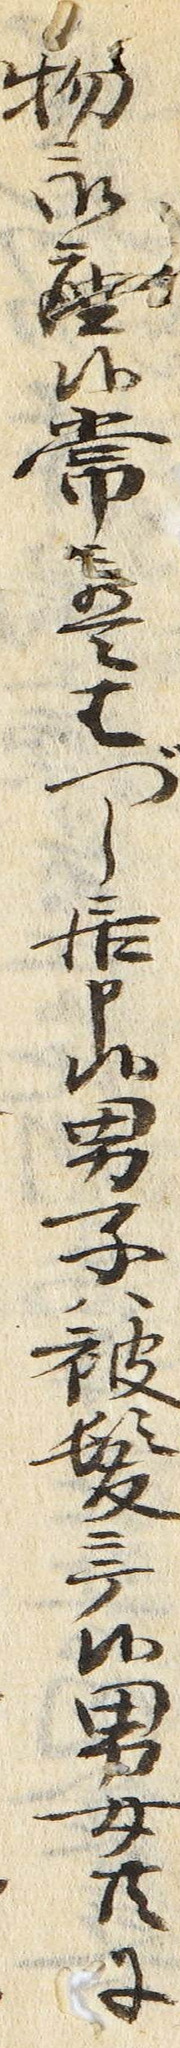物に御座候常にははづし居申候男子は被髪にて候男女共に
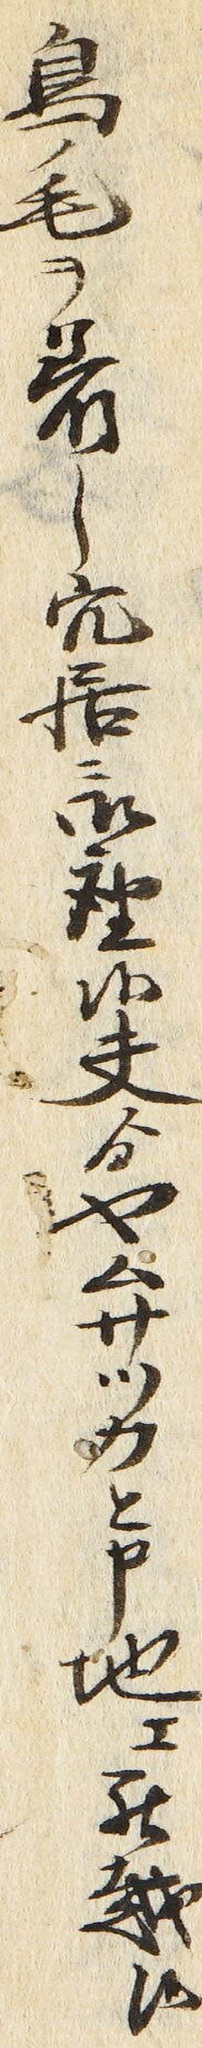鳥の毛を着し穴居に御座候夫ゟヤムサツカと申地え罷越候
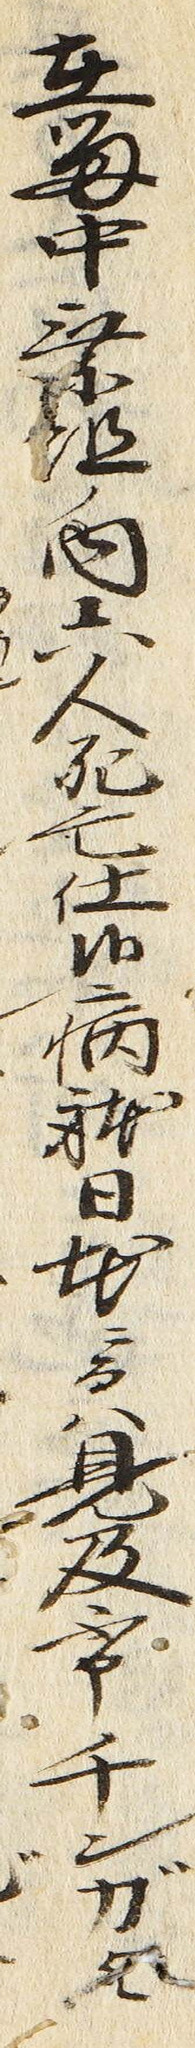在留中乗組の内六人死亡仕候病体日本にては見及不申チンガと
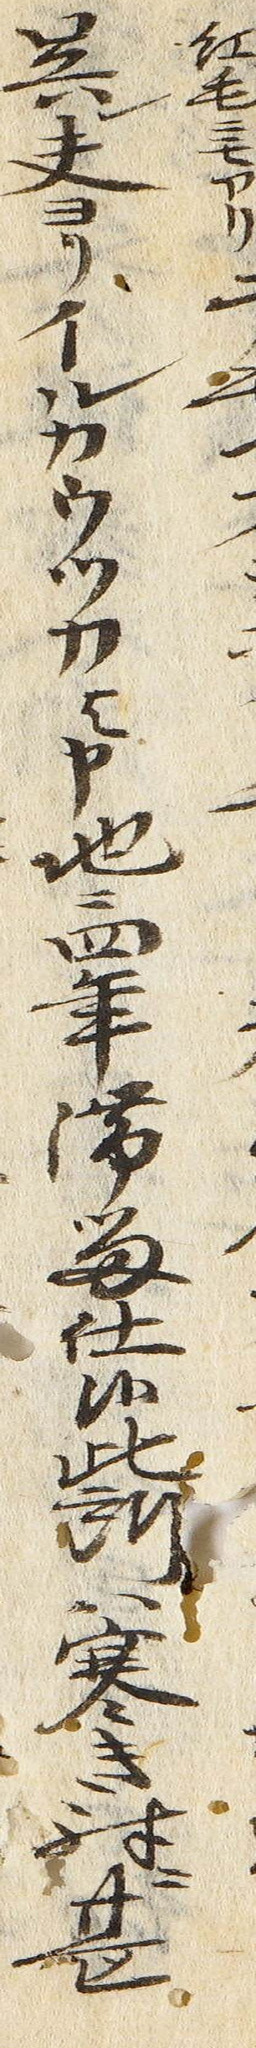呉れ夫よりイルカウツカと申地に四年滞留仕候此所は寒き殊に甚
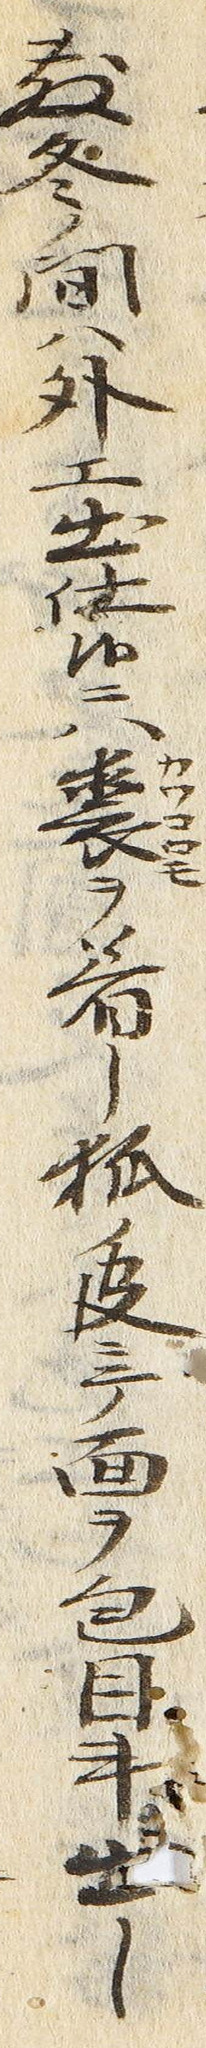敷冬の間は外え出仕候には裘を着し狐の皮にて面を包目斗出し
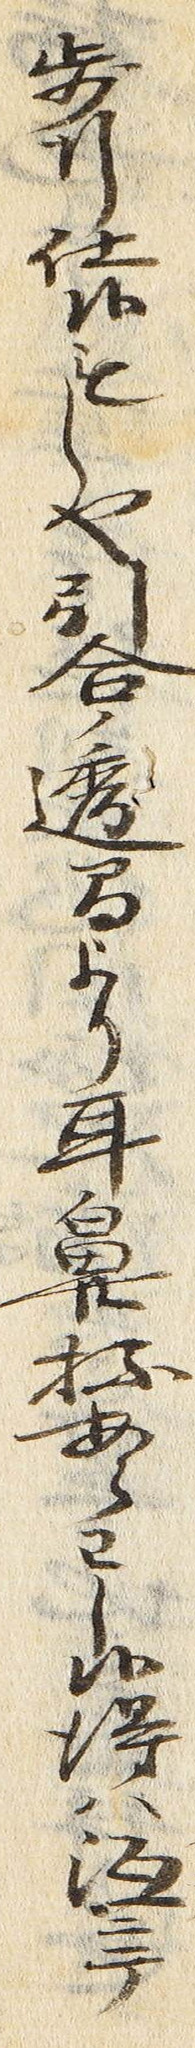歩行仕候もしや引合の透間より耳鼻抔あらわし候得は沍にて
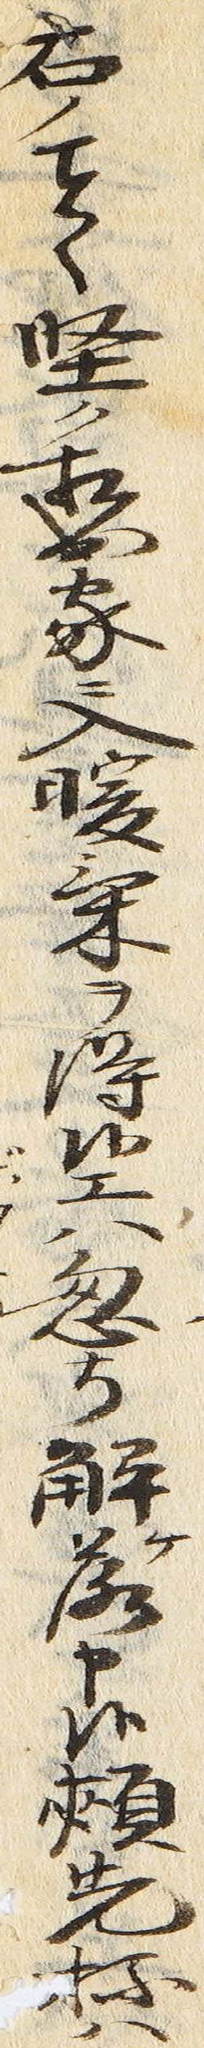石のことく堅く相成家に入暖気を得候えは忽ち解け落申候頬先抔は
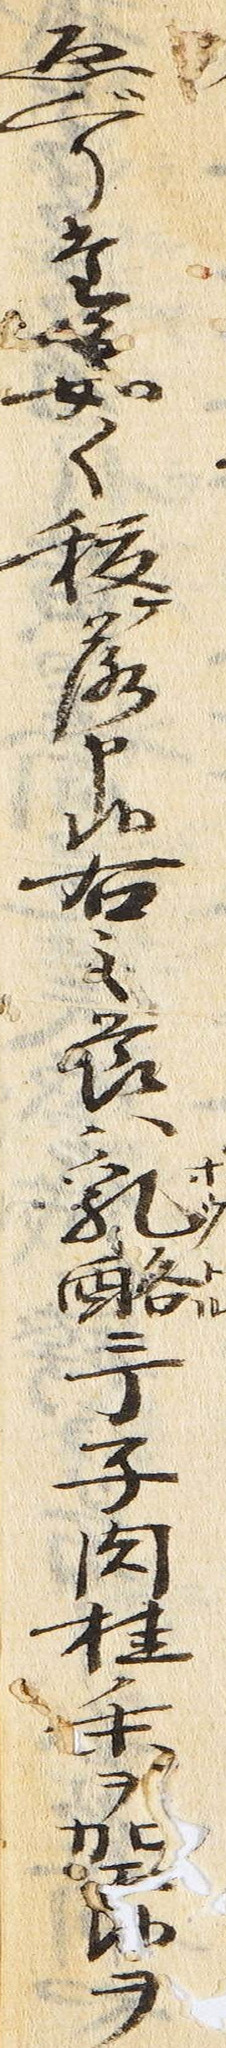ゑぐりたる如く抜け落申候右之節は乳酪に丁子肉桂の末を加え候を
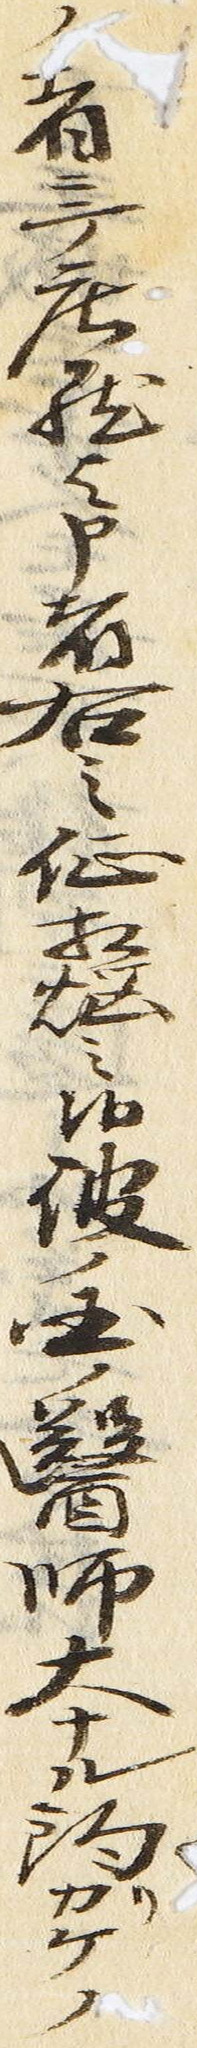の者にて庄蔵と申者右之証相悩み候彼の国の医師大なる釣りかけの
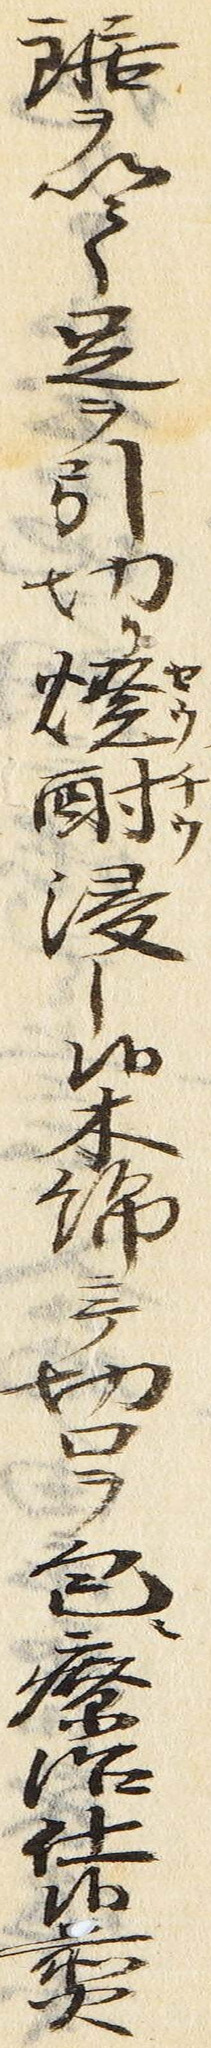鋸を以て足を引切り焼酎浸し候木綿にて切口を包み療治仕候煎
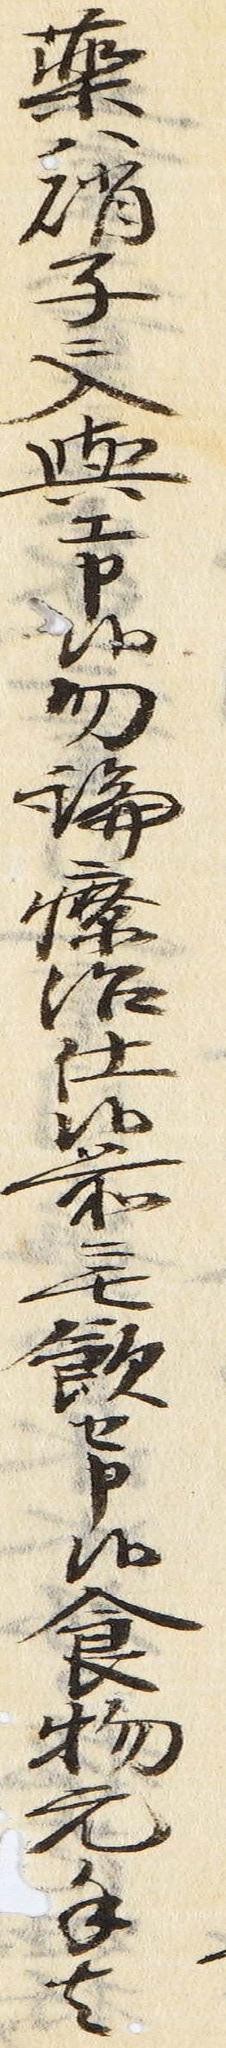薬は硝子に入与え申候勿論療治仕候前にも飲せ申候食物元手は
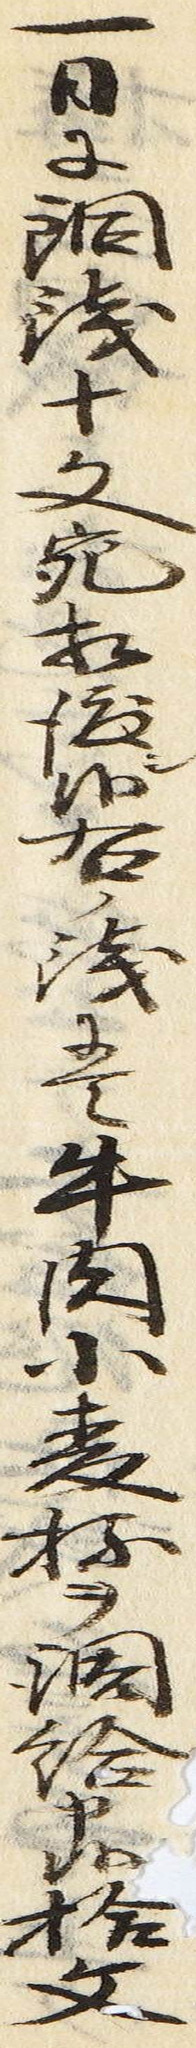一日に銅銭十文宛相渡し候右の銭にて牛肉小麦抔を調給申候拾文
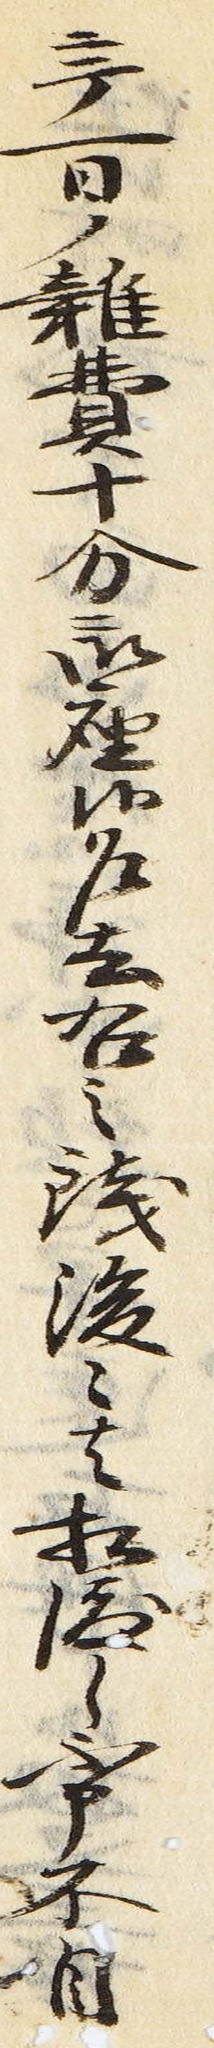にて一日の雑費十分に御座候乍去右之銭後々は相渡し不申不自
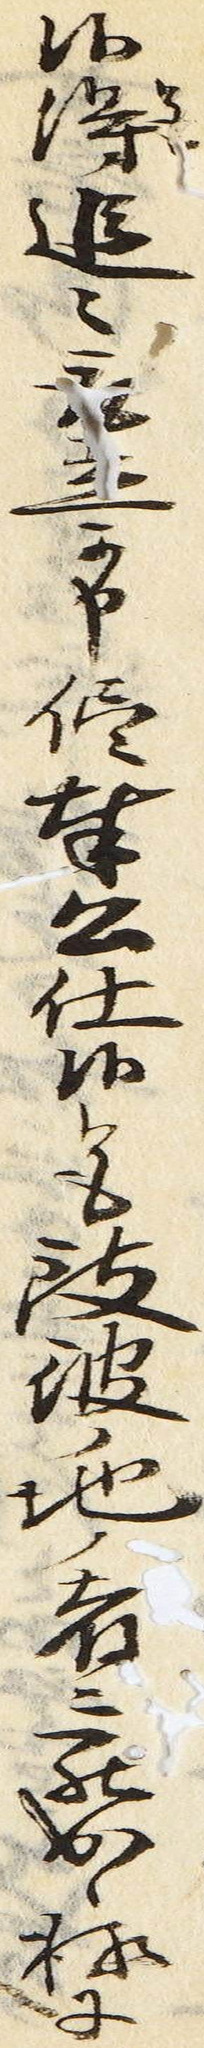候得追々取立可申侭奉公仕候とも致彼の地の者に罷成候様子
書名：神昌丸漂流問答
